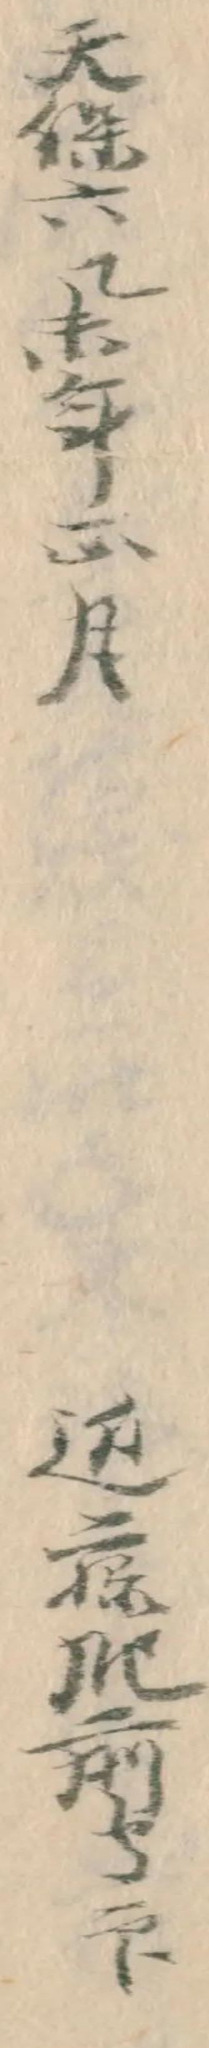天保六乙未年正月近藤肥前守印
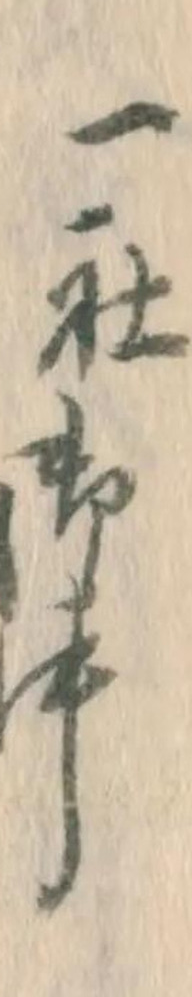一社御中
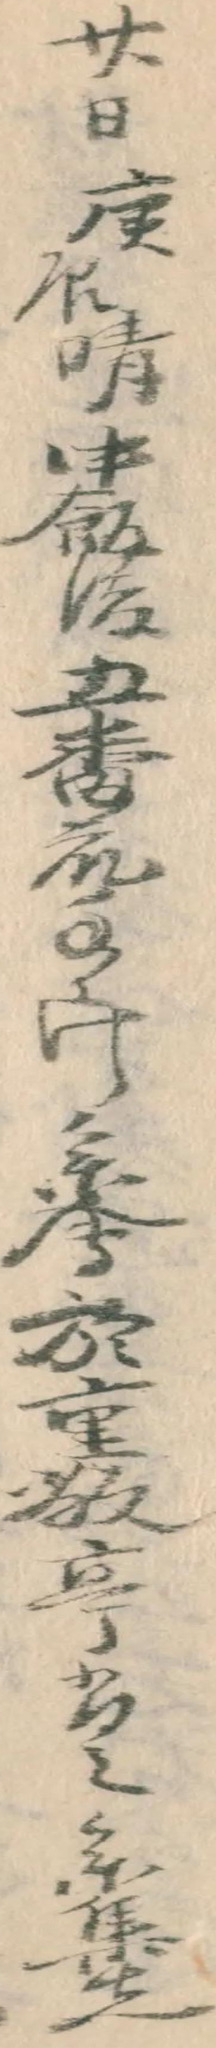廿日庚辰晴中飯渡五番衆手之汁参會於重敬亭有之参集先
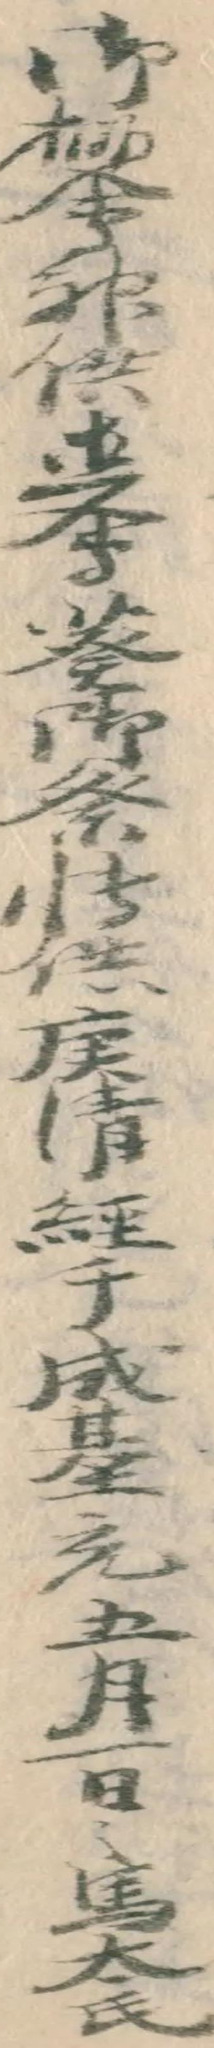御棚会神供直會葵御祭轉供庚清経千成基充五月一日之馬太氏
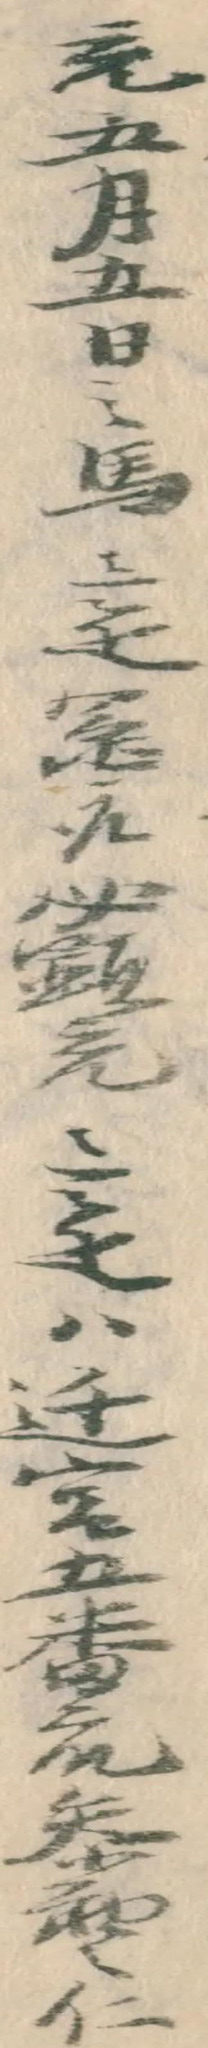充五月五日之馬壱疋鬮取必顕充壱疋ハ遷宮五番衆参勤之仁
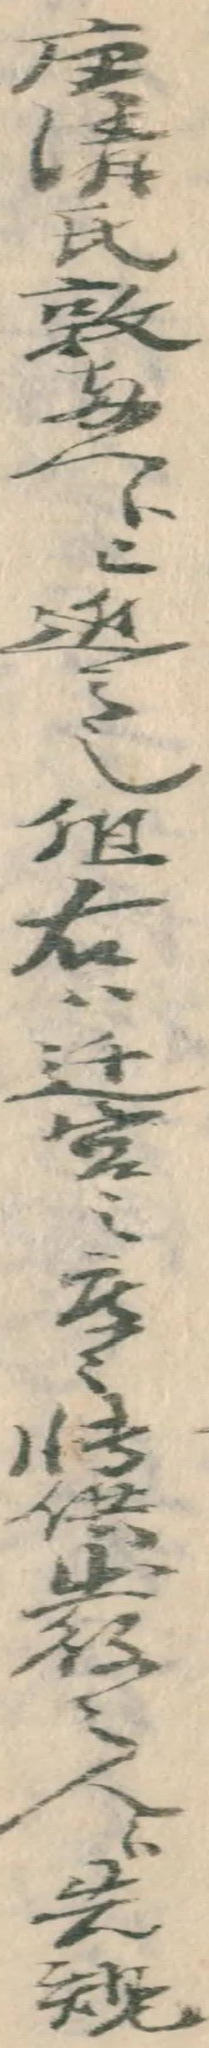庚清氏敦両人え被近馬也但右ハ遷宮之度々轉供出役之人え先規
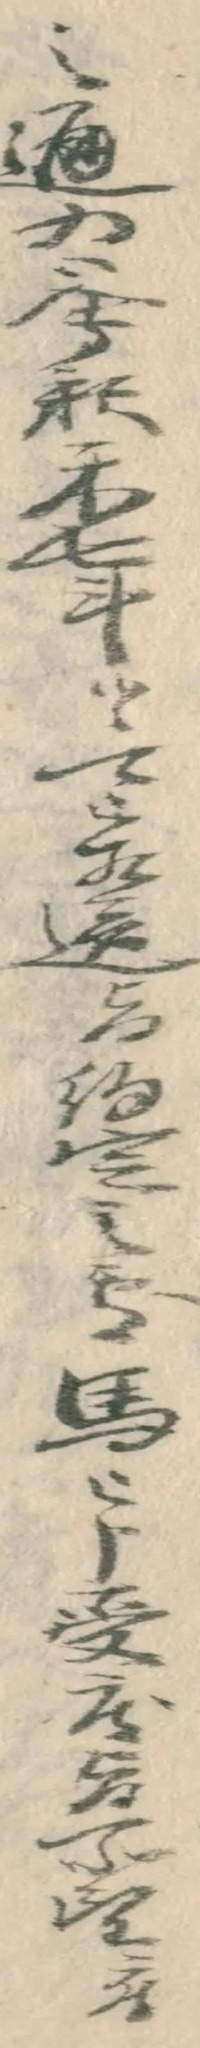之通為御會釈米七斗ツヽ可被相送旨約定之處馬被申受度旨所望ニ付
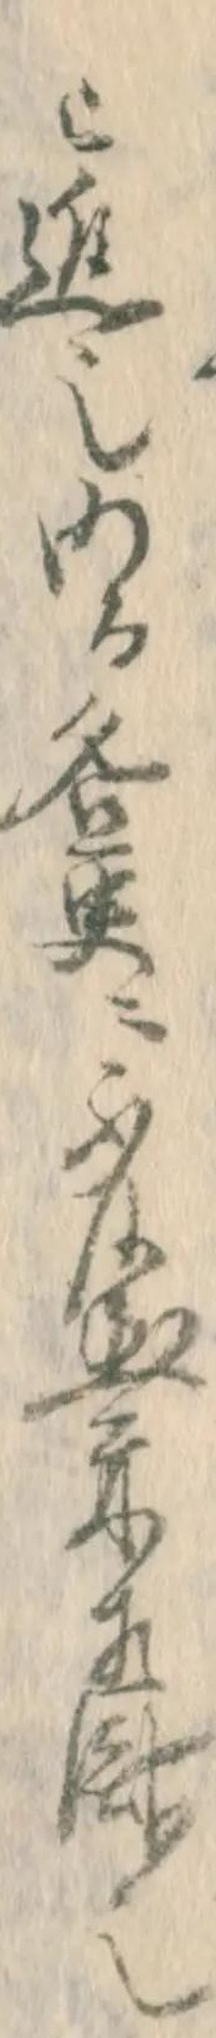被進也仍而各更に不及出米相済也
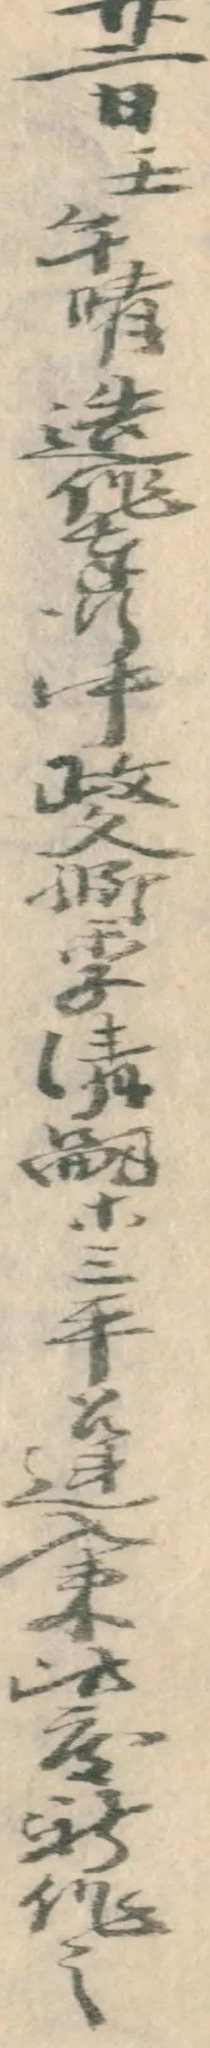廿二日壬午晴造作奉行中政久卿季清嗣等三平召連入来此度新作之
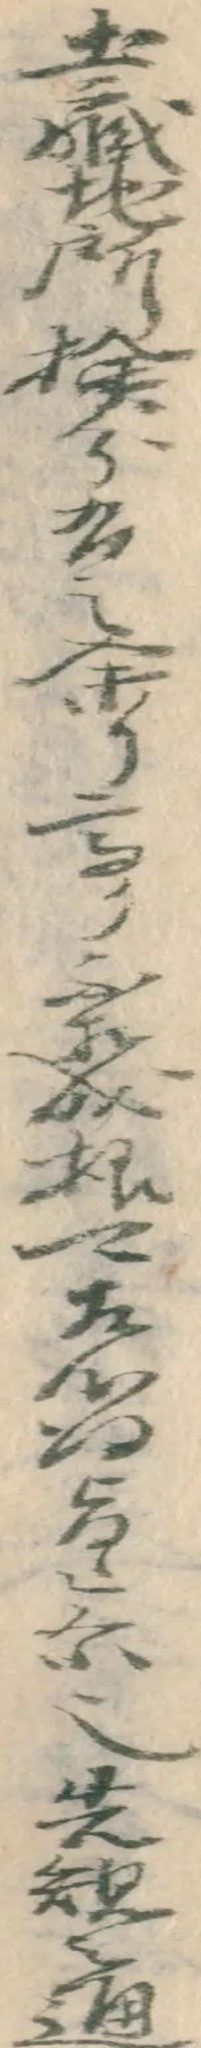土蔵地所検分有之余り高ク不相成様可相心得旨被察也先規之通

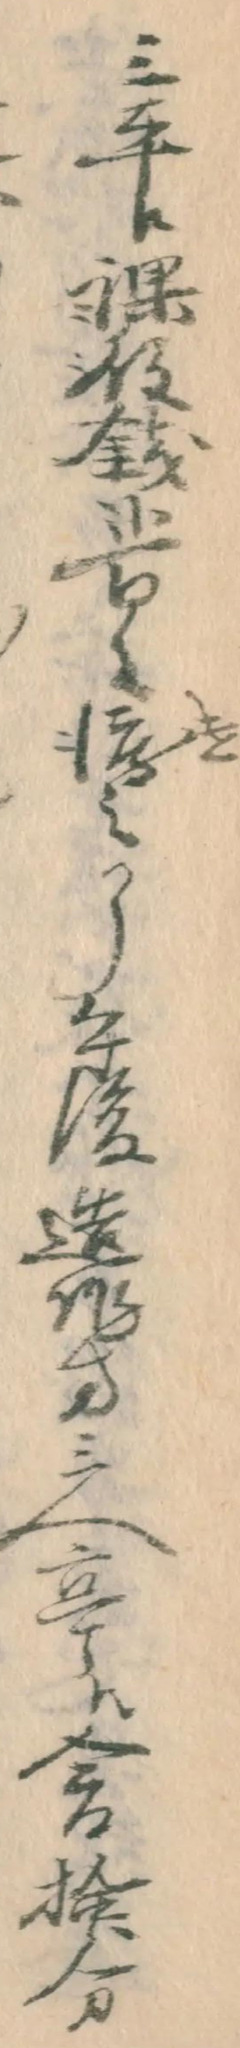三平え課役銭弐百文渡遣之了から午後造作方三人亭え今日検分
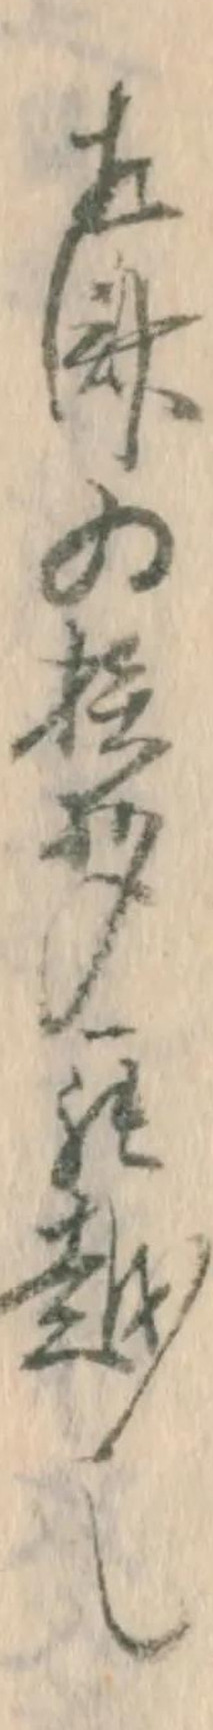相済為挨拶罷越也
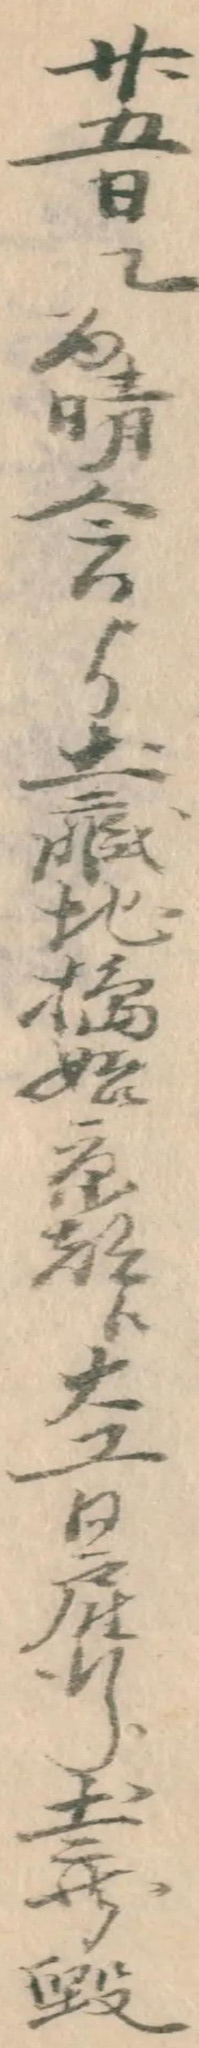廿五日乙酉晴今日より土蔵地搗始京都ゟ大工日雇行土蔵毀
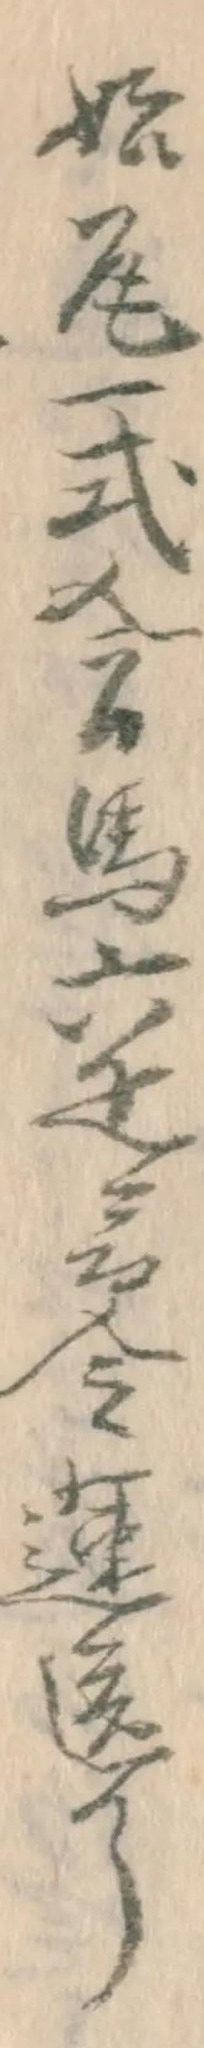始瓦一式入候馬六疋ニ而令運送了
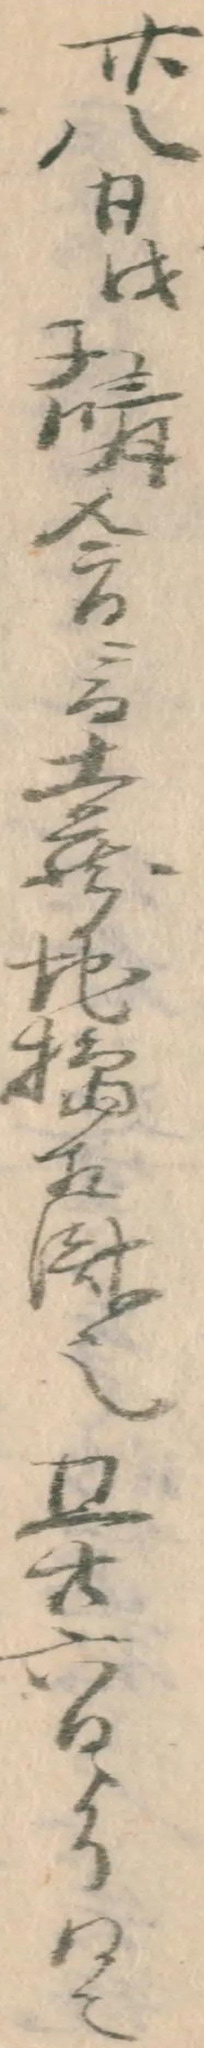廿八日戊子晴今日ニ而土蔵地搗相済也且廿六日より日々
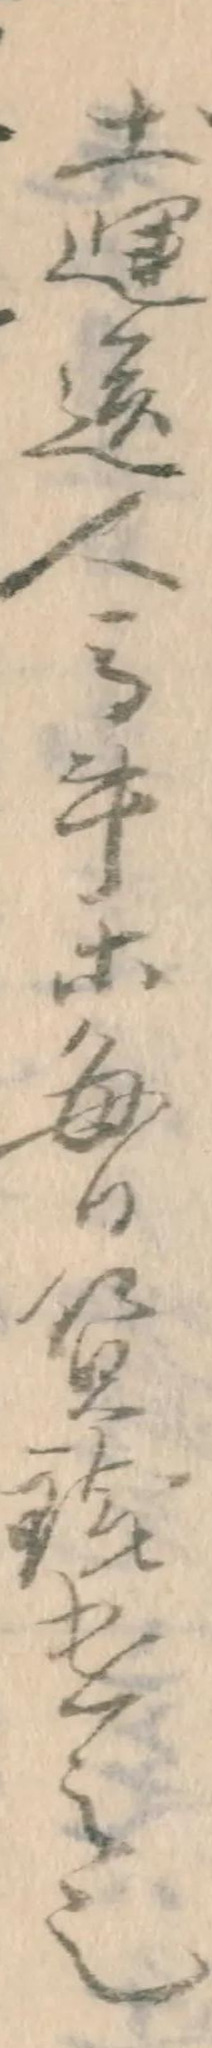土運送人馬牛等毎日賃銭遣之也
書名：賀茂社記録. 第67冊
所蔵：国立国会図書館 National Diet Library, JAPAN
